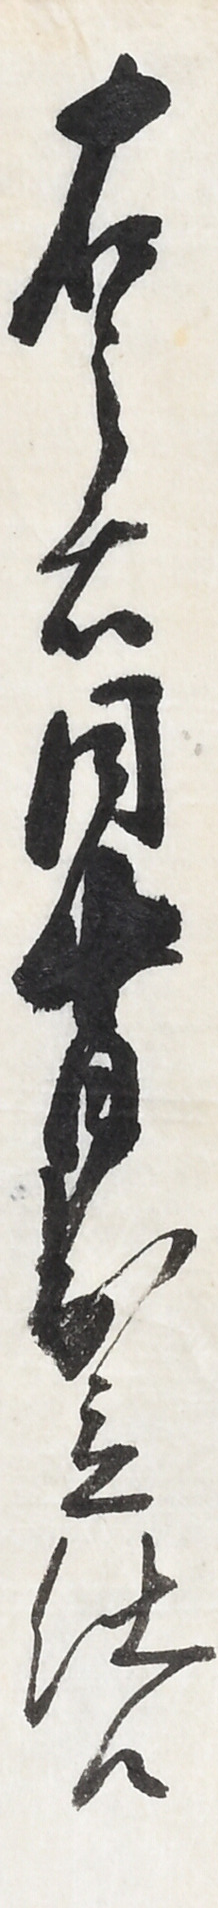右之者同十日出立仕候・
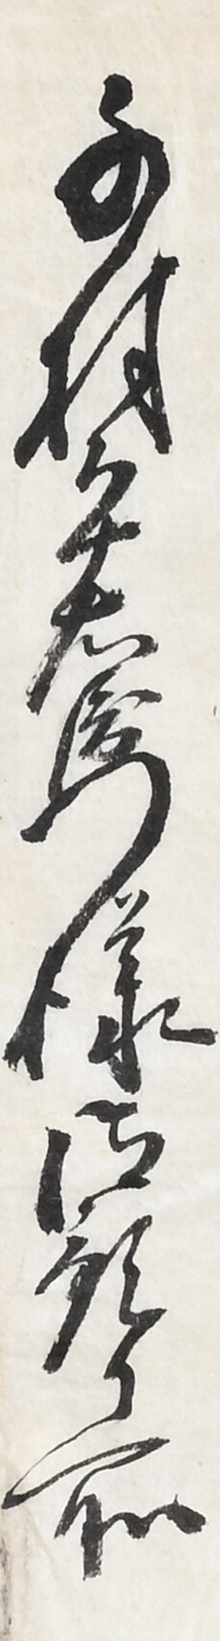千村平右衛門様御預り所
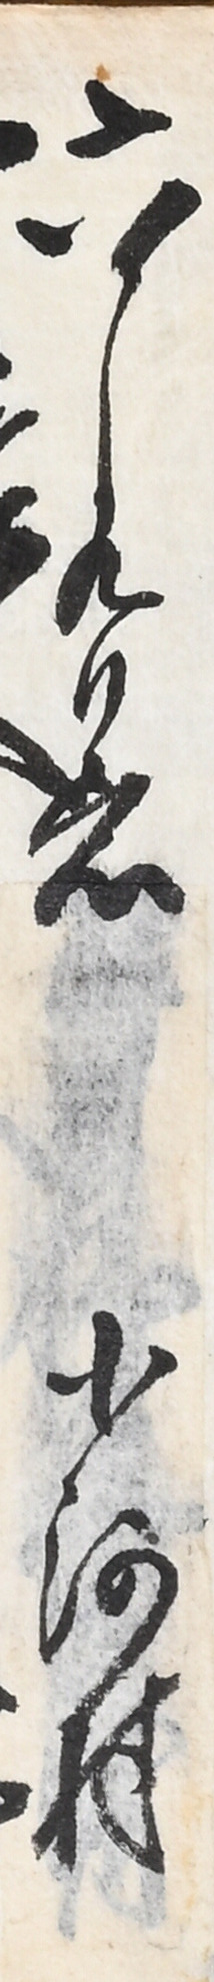六月九日着小河村
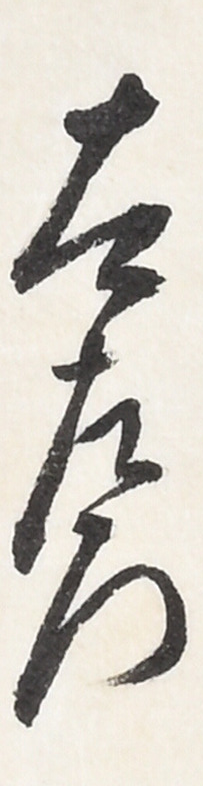太左衛門
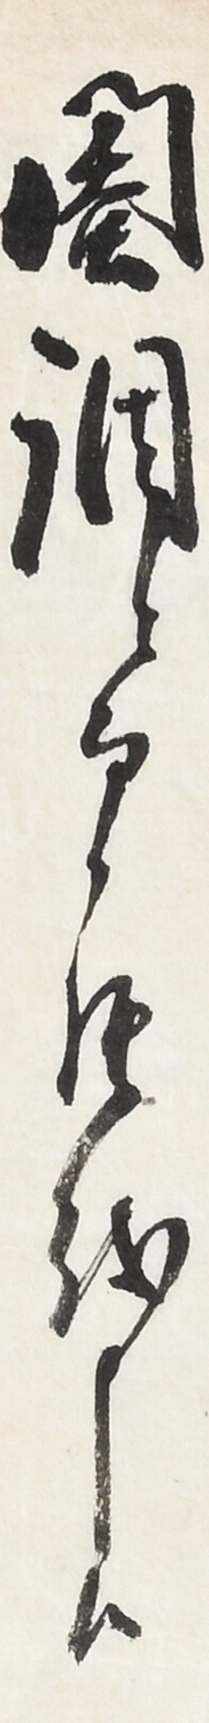関調ニ而罷越申候
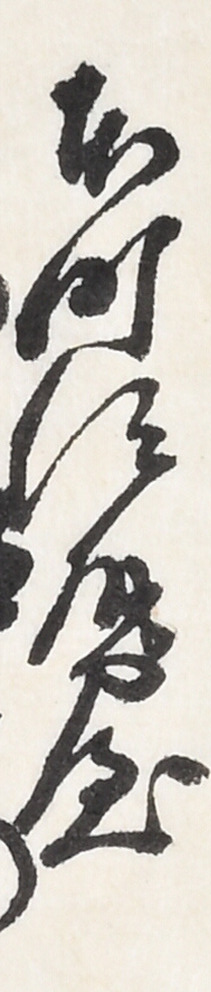本町いせ屋
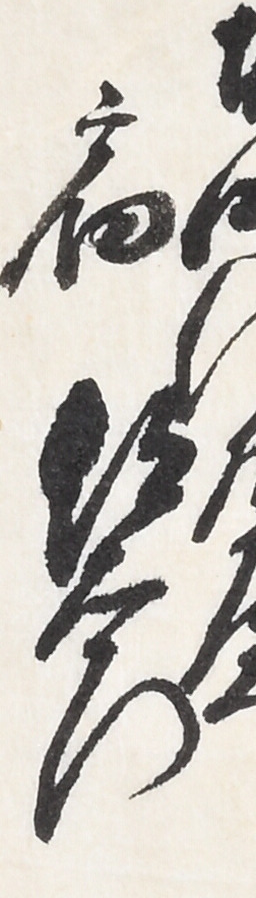宿伊右衛門
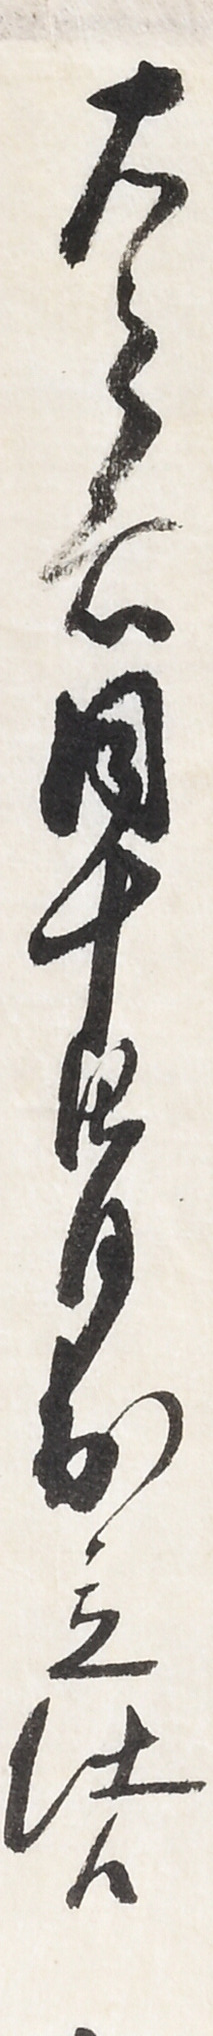右之者同十四日出立仕候・
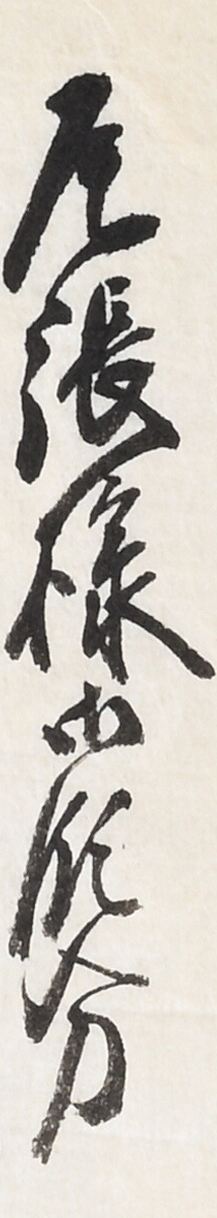尾張様御領分
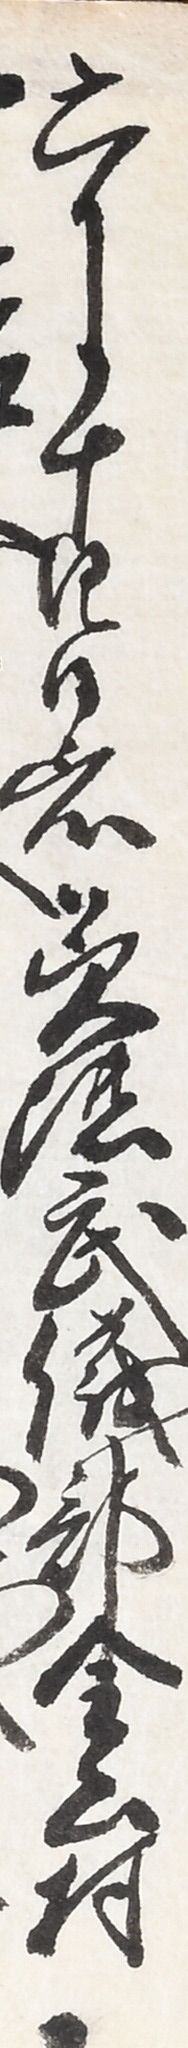六月十四日着美濃武儀郡金山村・
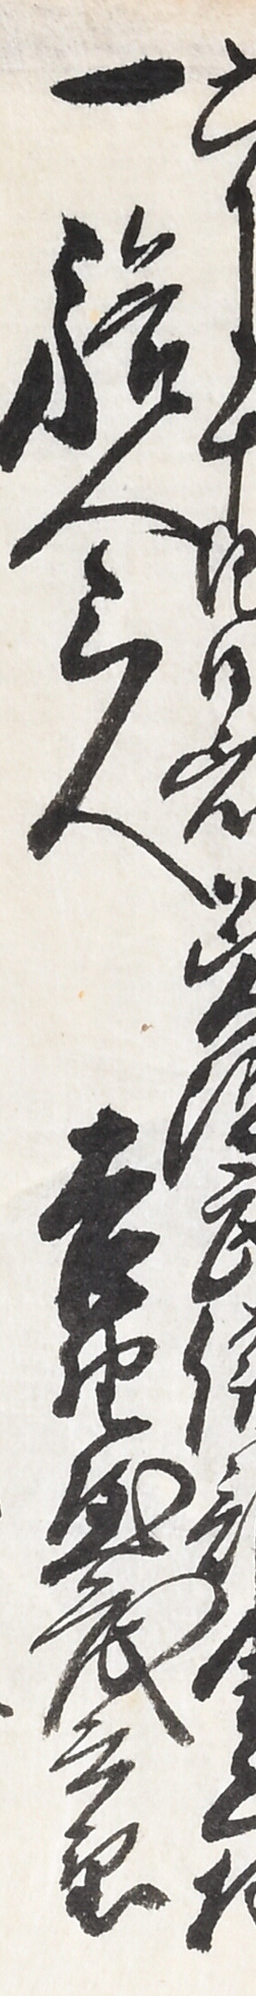一旅人三人吉野屋茂兵衛
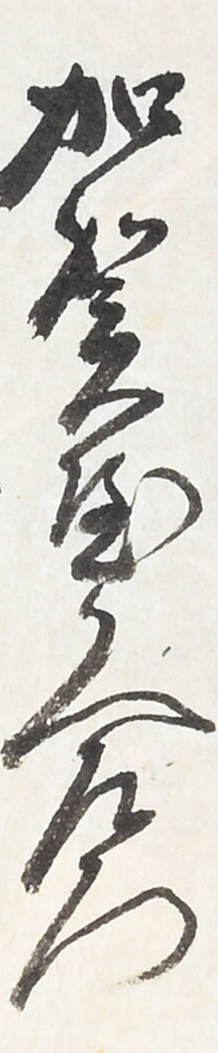加賀屋久左衛門
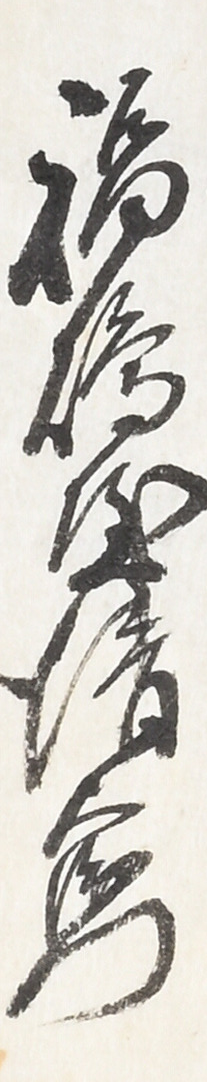福嶋屋清右衛門
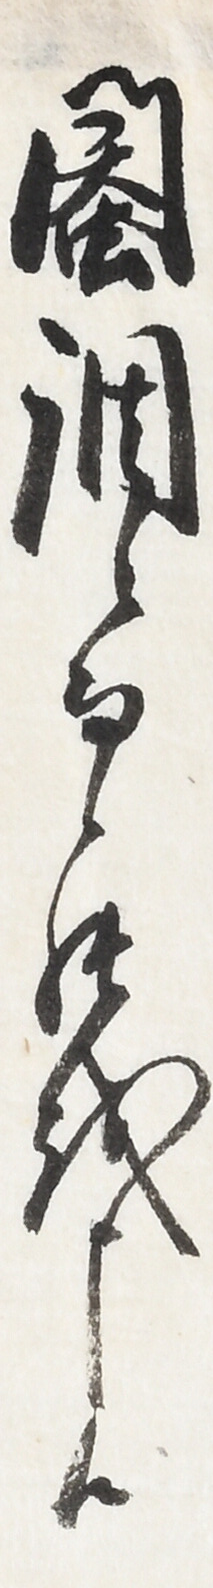関調ニ而罷越申候
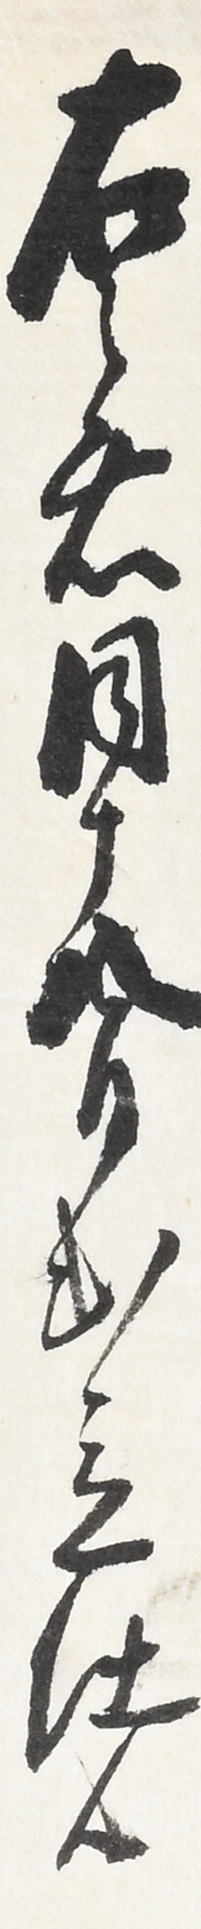右之者同十八日出立仕候
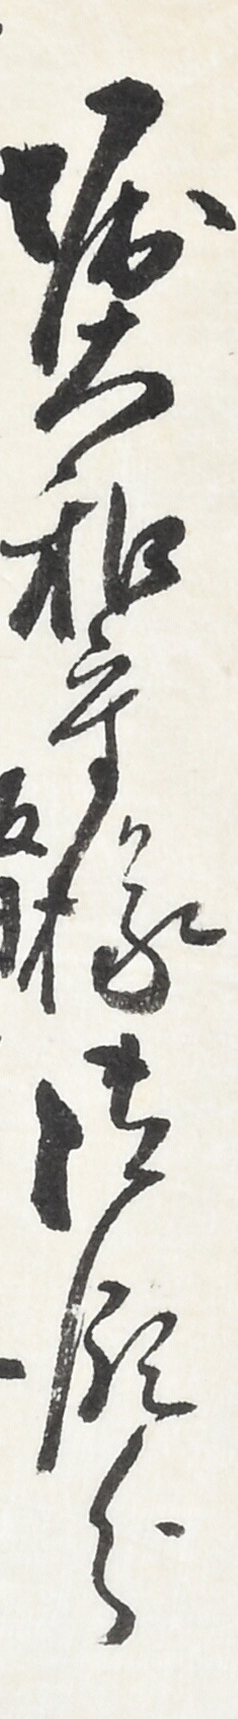堀大和守様御領分
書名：旅人泊控帳
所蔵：伊那市立高遠町図書館・合同会社AMANE
